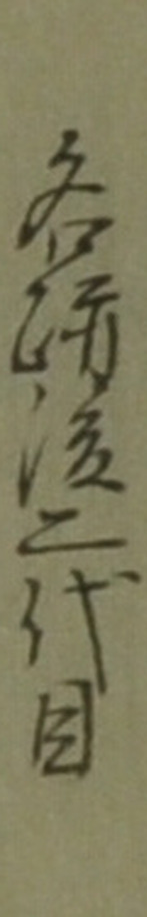名跡後二代目
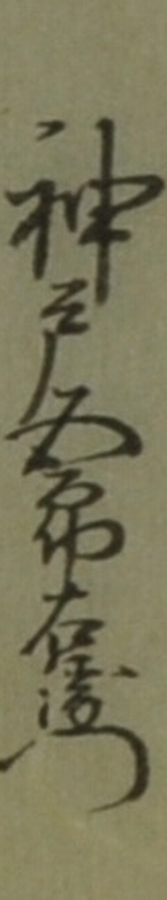神戸五郎右衛門
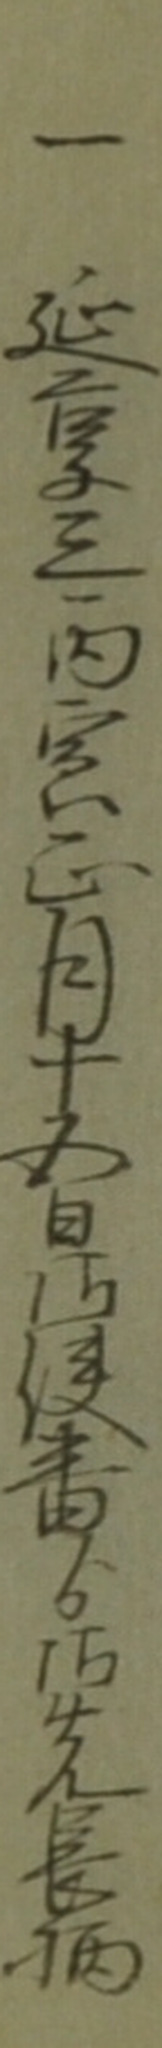一延享三丙寅正月十五日御使番ゟ御先長柄
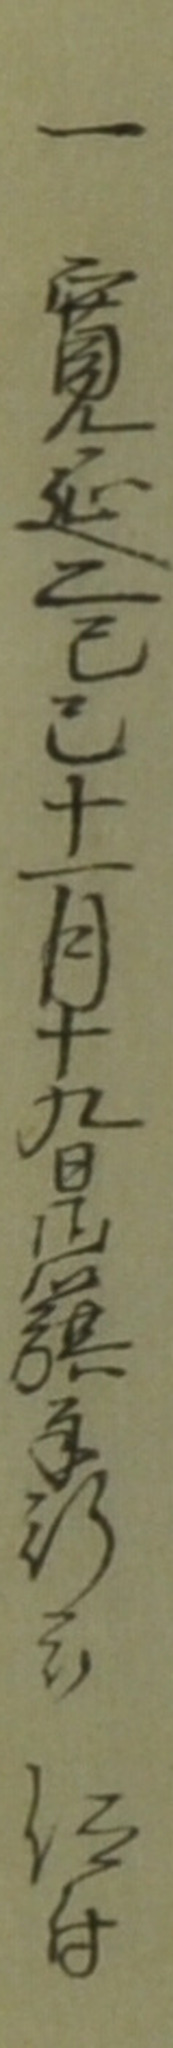一寛延二己巳十一月十九日御旗奉行被仰付
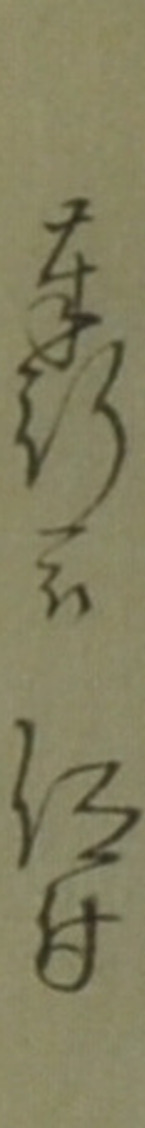奉行被仰付

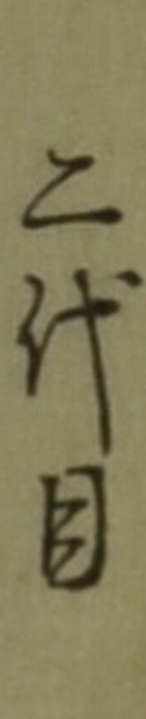二代目
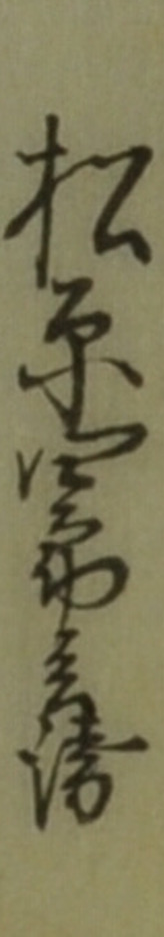松原四郎兵衛
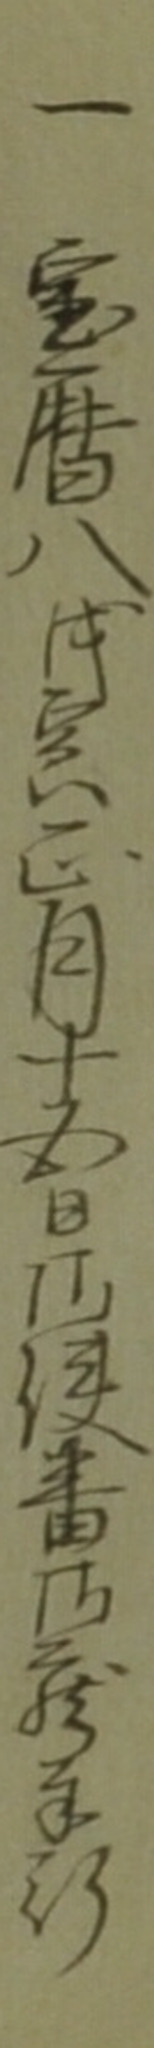一宝暦八戊寅正月十五日御使番御蔵奉行
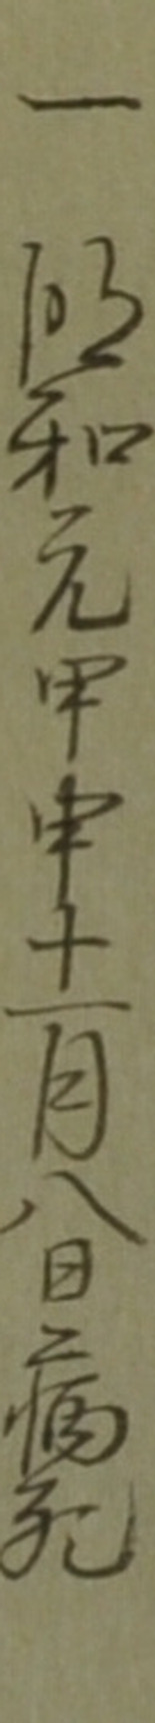一明和元甲申十一月八日病死
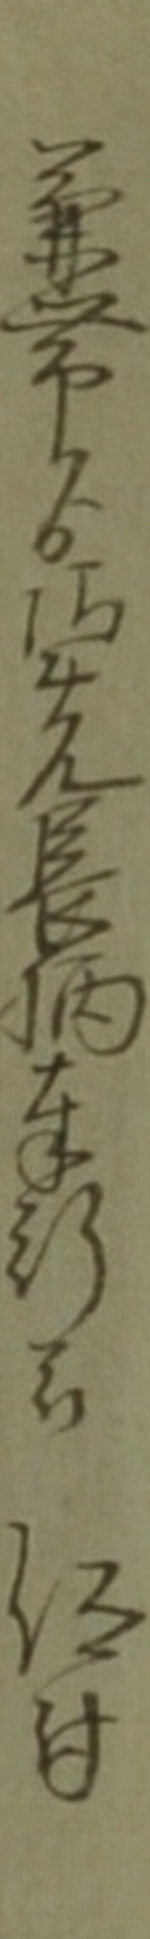兼帯ゟ御先長柄奉行被仰付
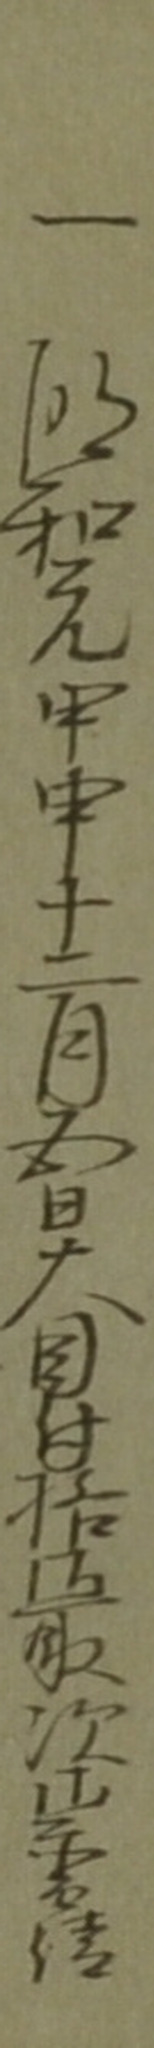一明和元甲申十二月五日大目付格御取次御普請
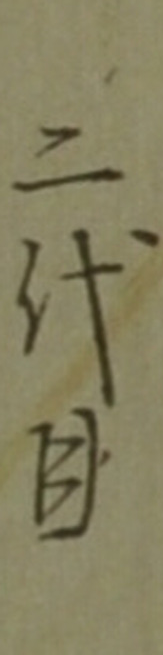二代目
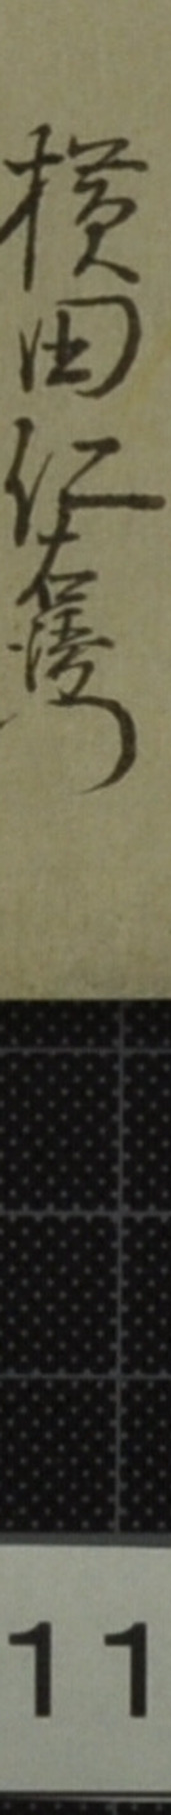横田仁右衛門
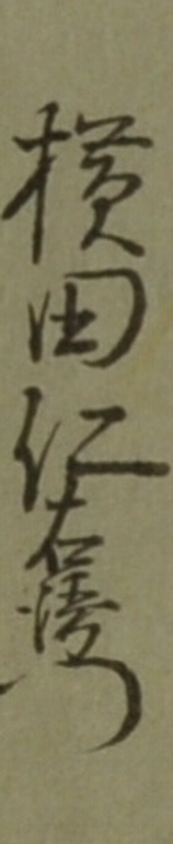横田仁右衛門
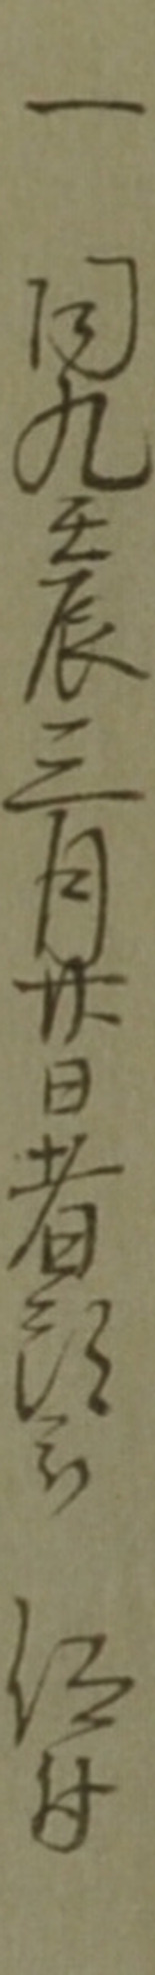一同九壬辰三月廿日者頭被仰付
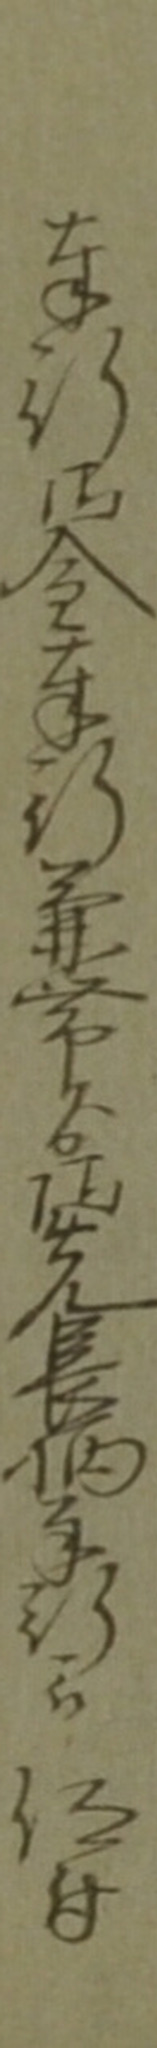奉行御金奉行兼帯ゟ御先長柄奉行被仰付
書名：諸御役代々録（三）
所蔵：伊那市立高遠町図書館・合同会社AMANE
